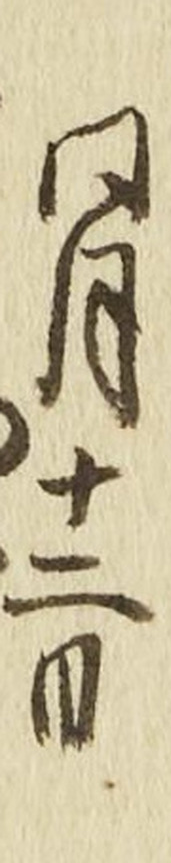同月十二日
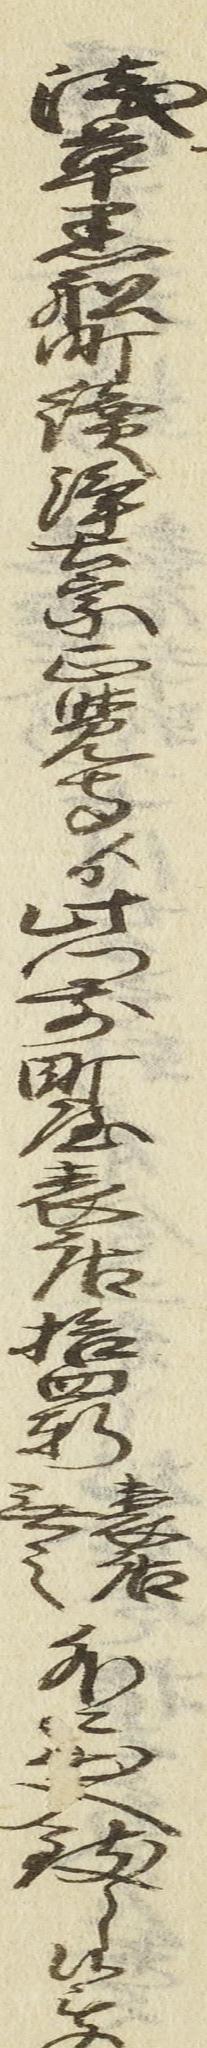一浅草黒船町続浄土宗正覚寺ゟ此門前町屋表店拾四軒裏店無之外ニ出入致し候もの
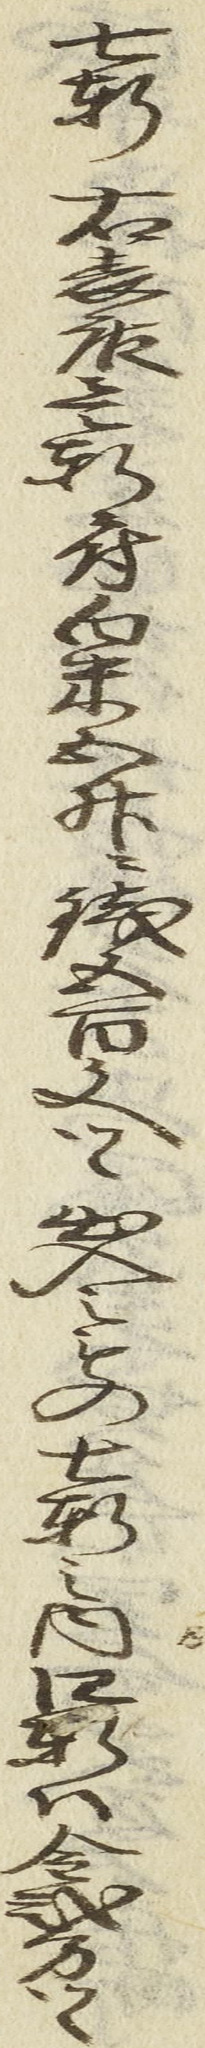七軒右表店壱軒ニ付白米五升ニ銭五百文ツヽ出入之もの七軒之内四軒は金弐分ツヽ
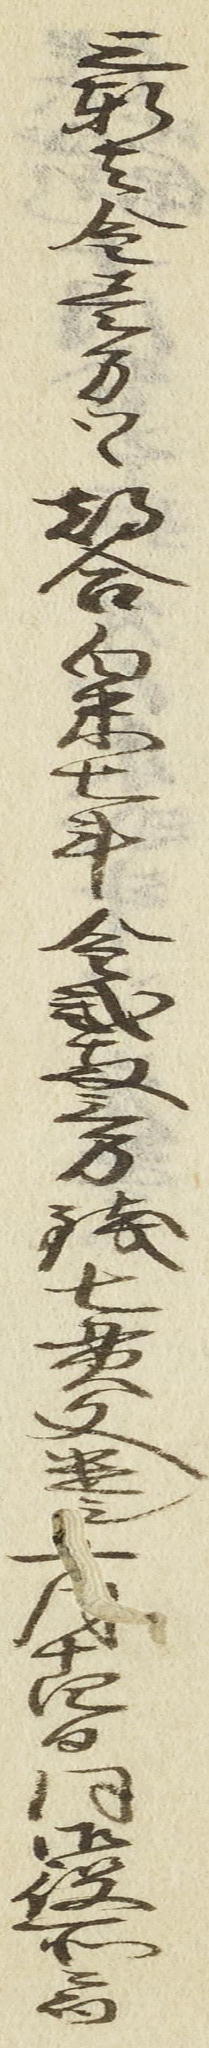三軒者金壱分ツヽ都合白米七斗金弐両三分銭七貫文遣シ十月十四日同御役所ニ而
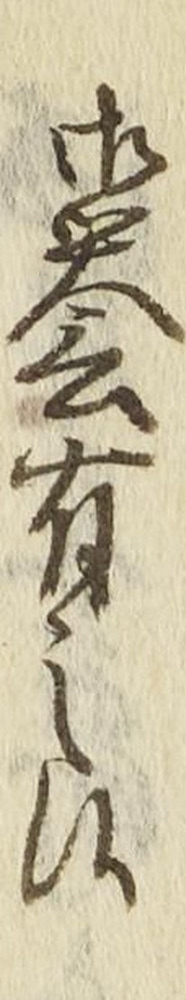御誉有之候
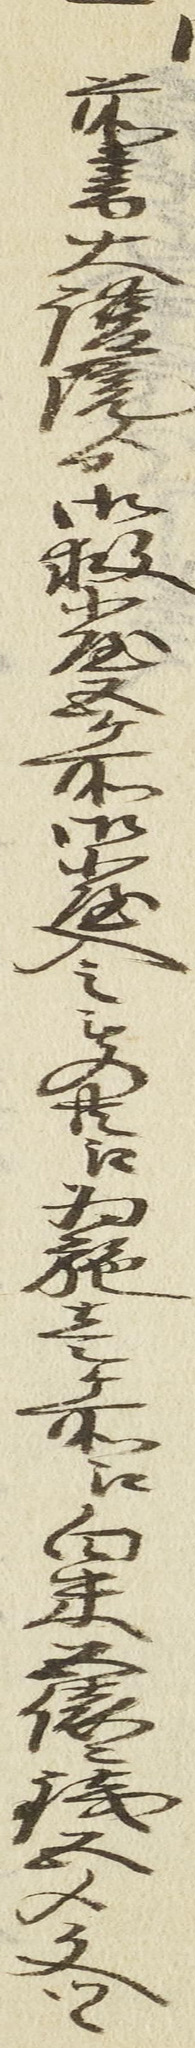一前書大護院ゟ御救小屋五ケ所御小屋入之もの共江為施壱ケ所江白米五俵ニ銭五貫文ツヽ
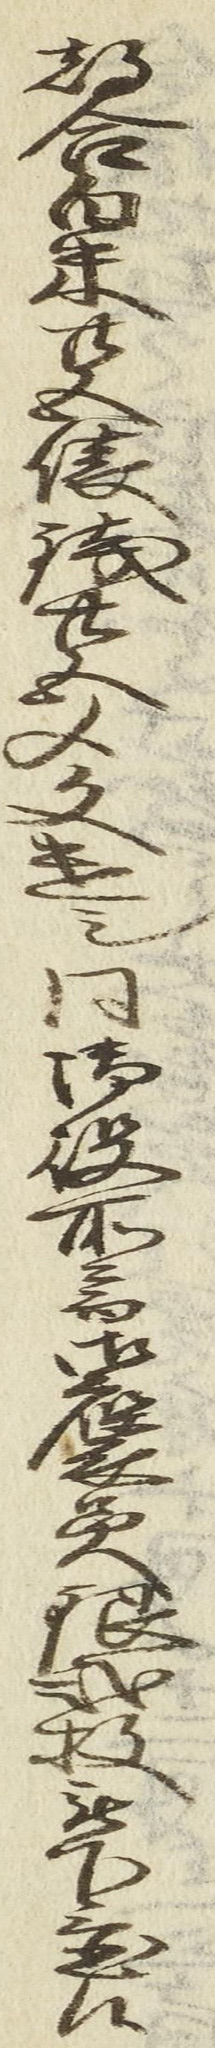都合白米廿五俵銭廿五貫文遣シ同御役所ニ而御褒美銀弐枚被下置候
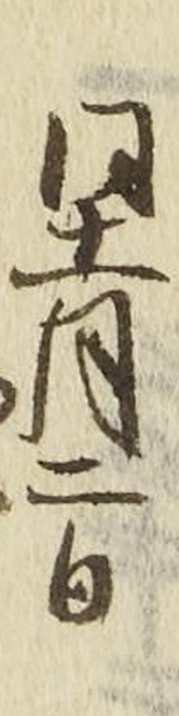同十一月二日
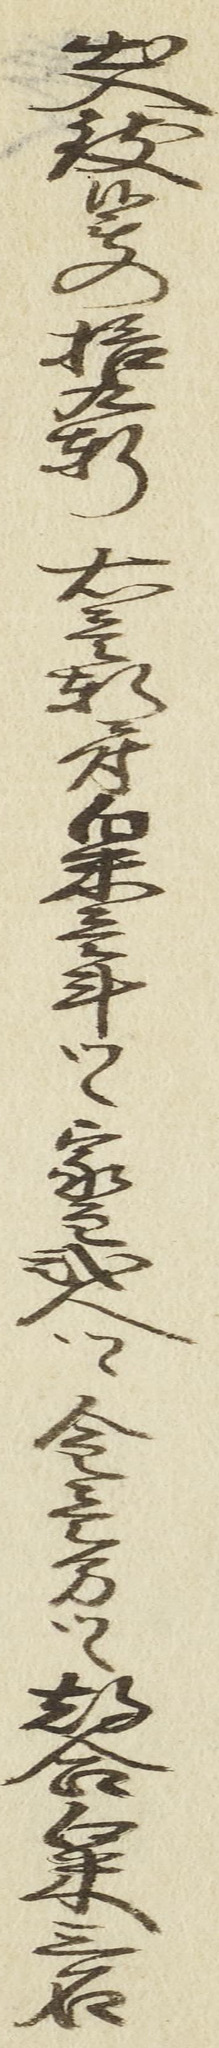出入致候もの拾九軒右壱軒ニ付白米壱斗ツヽ家主弐人ツヽ金壱分ツヽ都合白米三石
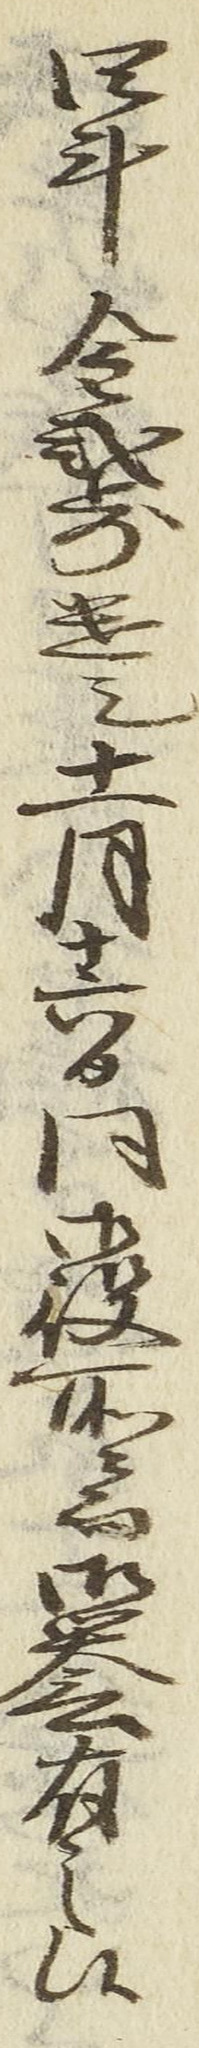四斗金弐歩遣シ十一月十六日同御役所ニ而御誉有之候
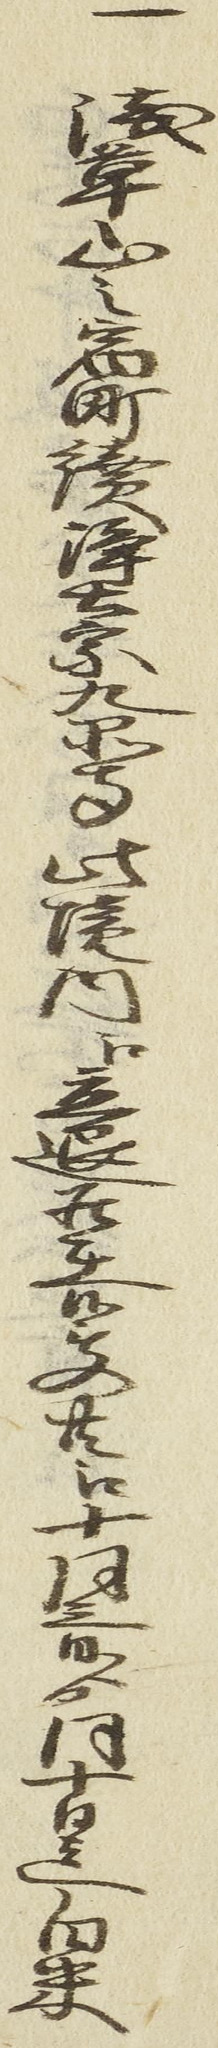一浅草山之宿町続浄土宗九品寺此境内江立退罷在候もの共江十月三日ゟ同十日迄白米
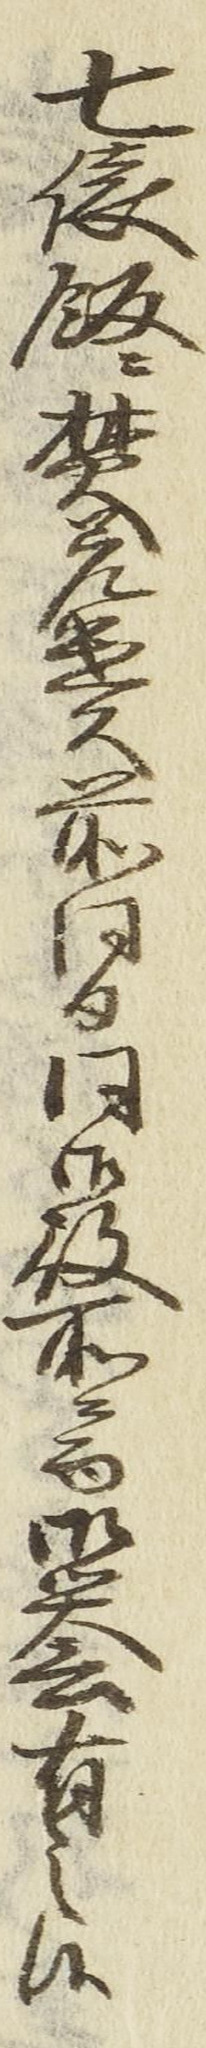七俵飯ニ焚差遣ス前同日同御役所ニ而御誉有之候

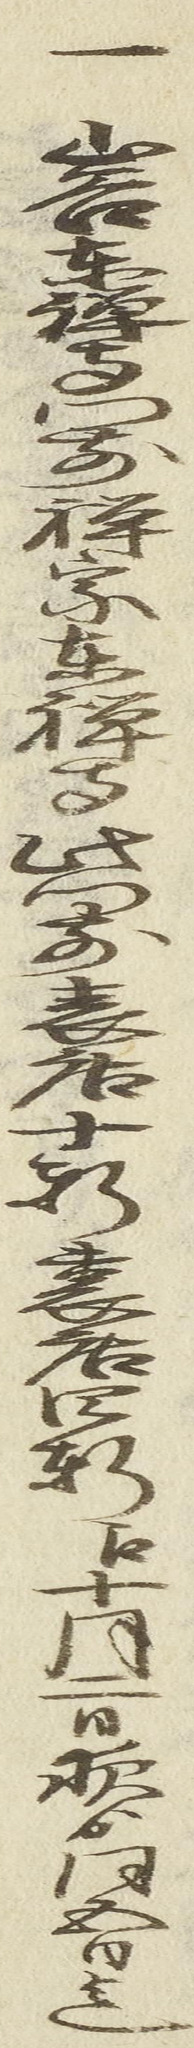一山谷東禅寺門前禅宗東禅寺此門前表店十軒裏店四軒江十月二日夜ゟ同五日迄
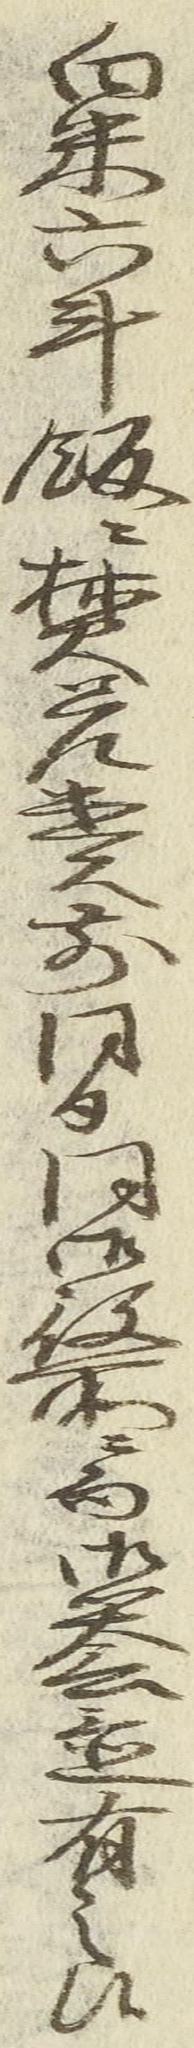白米六斗飯ニ焚差遣ス前同日同御役所ニ而御誉置有之候
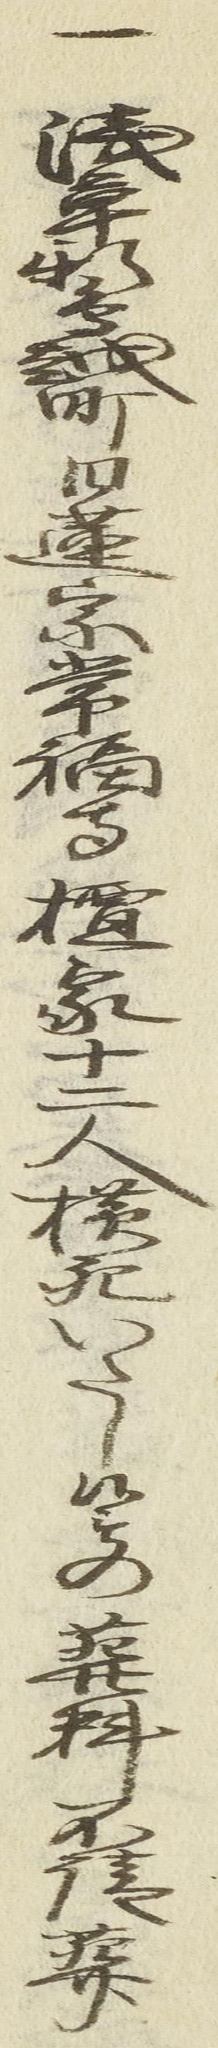一浅草新鳥越町日蓮宗常福寺檀家十二人横死いたし候もの葬料不請葬
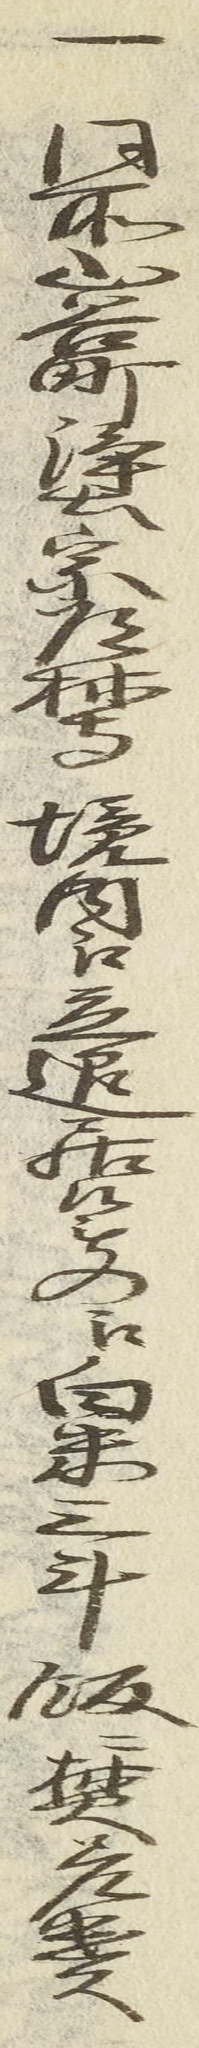一同所山谷町浄土宗道林寺境内江立退居候もの江白米三斗飯ニ焚差遣ス
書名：安政二年震災記事　完
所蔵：東京大学地震研究所図書室 Earthquake Research Institute Library, The University of Tokyo, JAPAN
